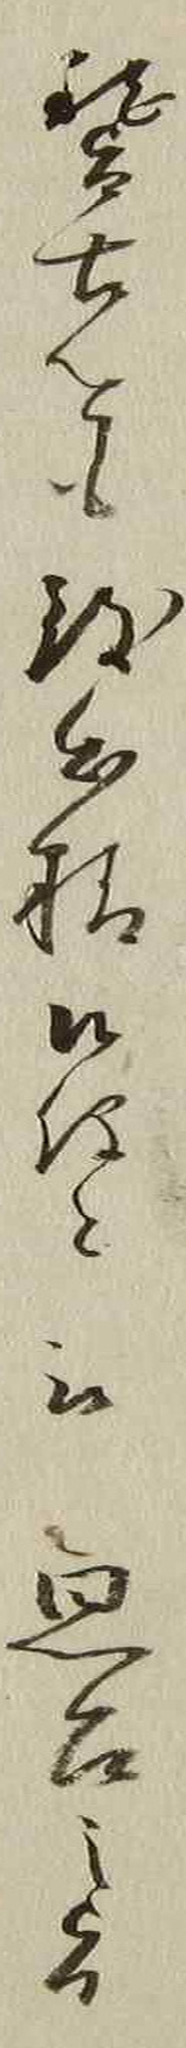稽古をも致出精候儀と被思召之旨
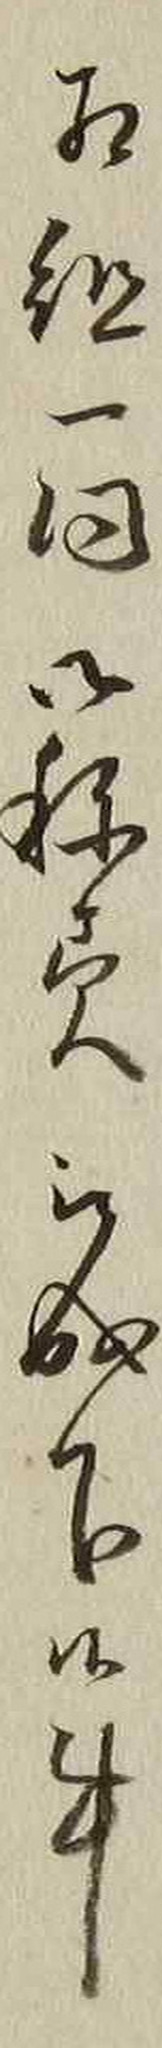相組一同御称美被成下候事
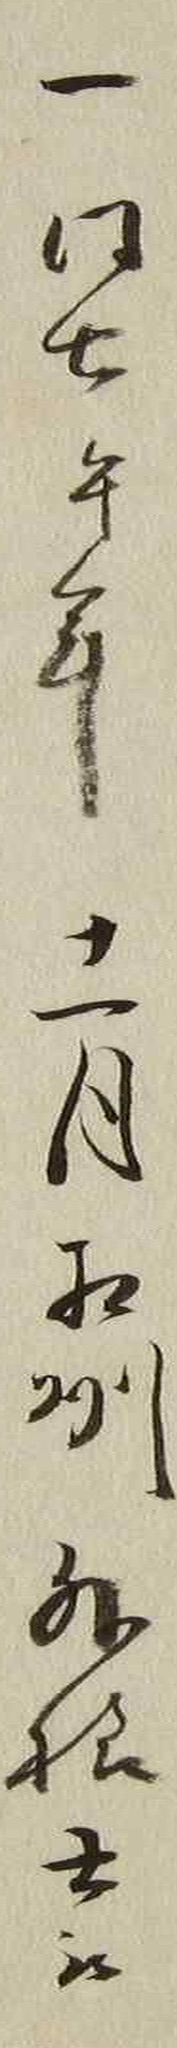一同七午年十一月相州外様士被
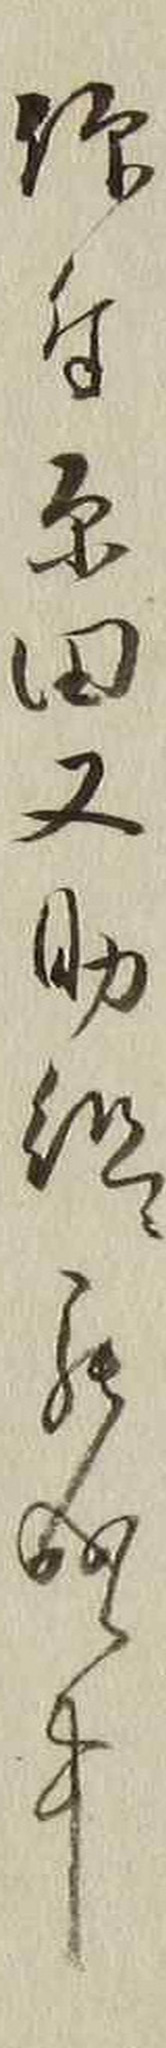仰付原田又助組ニ罷成候事
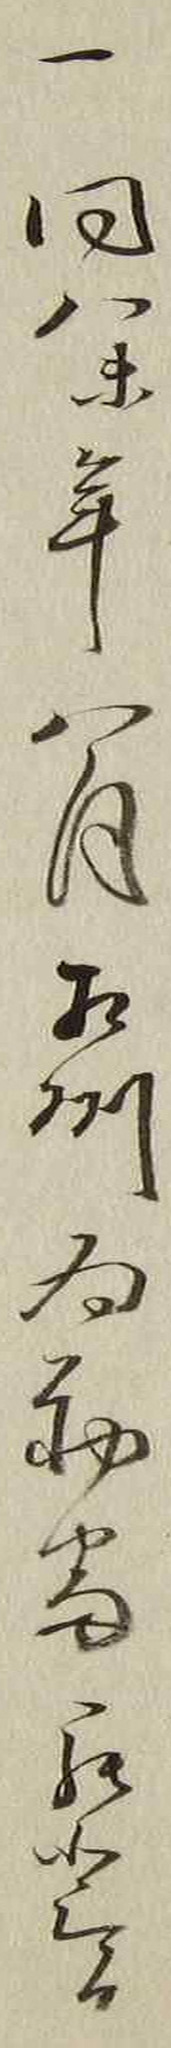一同八未年八月相州為勤番罷登候
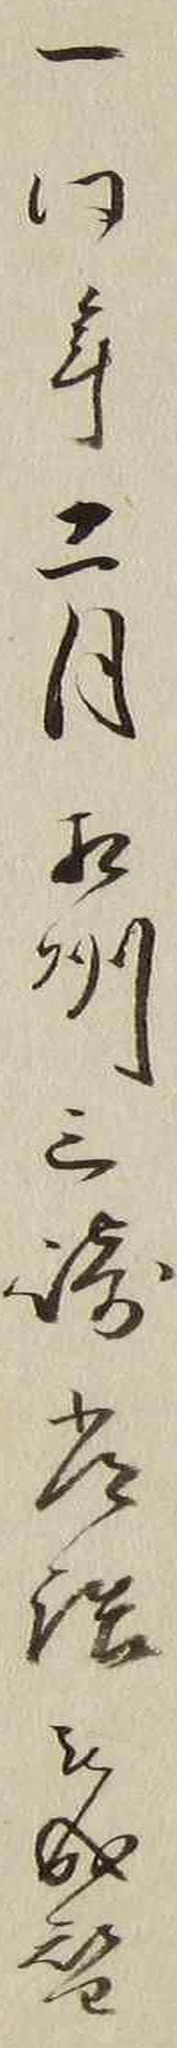一同年十一月相州三崎常詰被成替
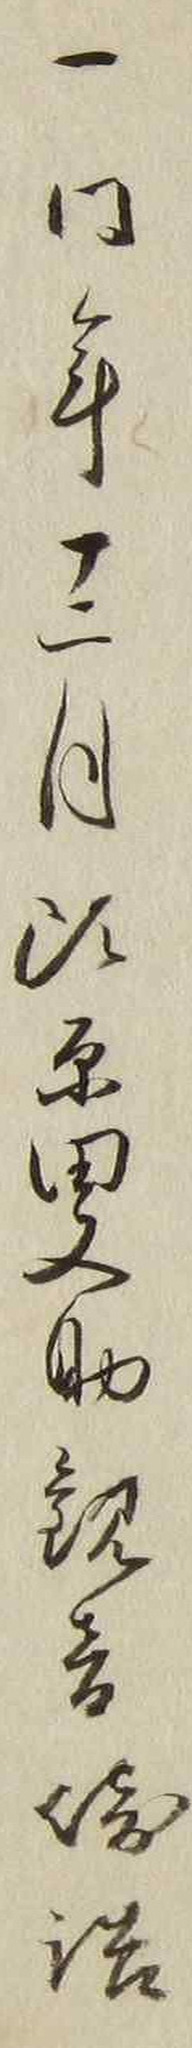一同年十二月頭原田又助観音崎詰

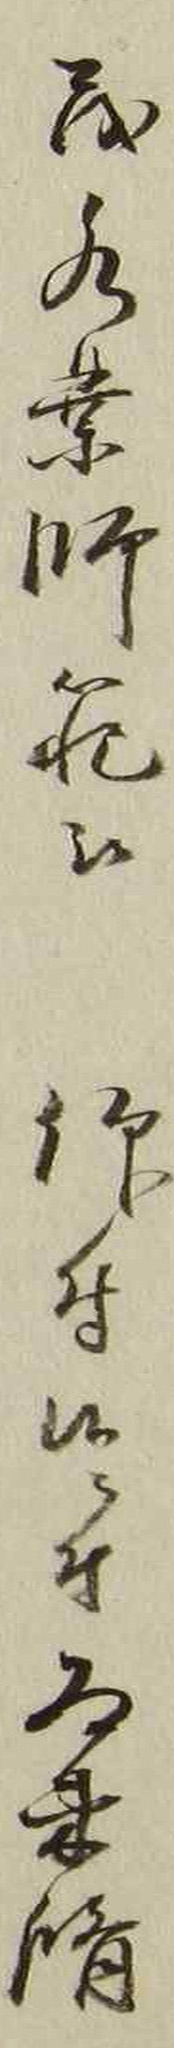茂水業師範被仰付候ニ付為束脩
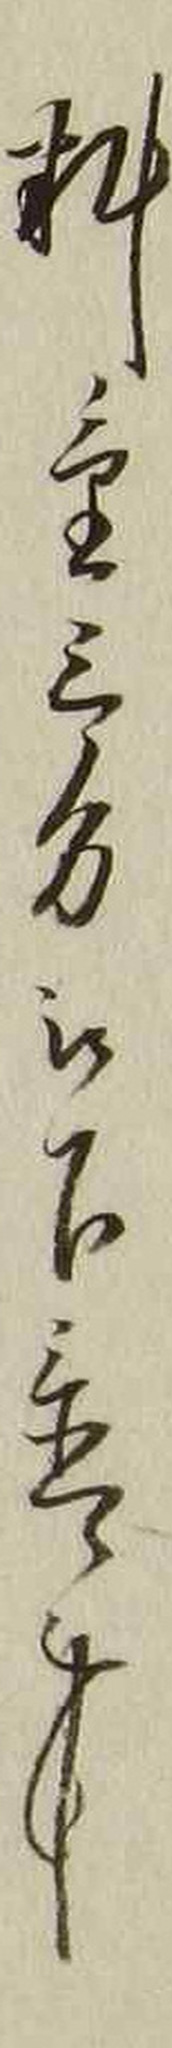料金三分被下置候事
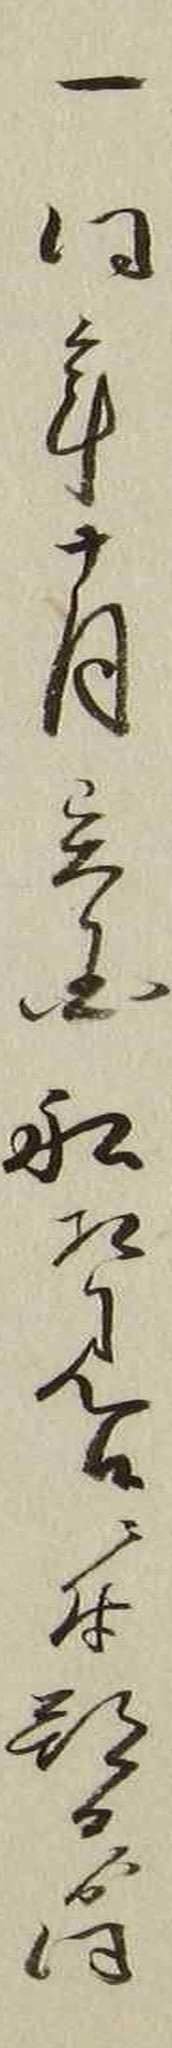一同年十月異国船相見候ニ付朔日ゟ同
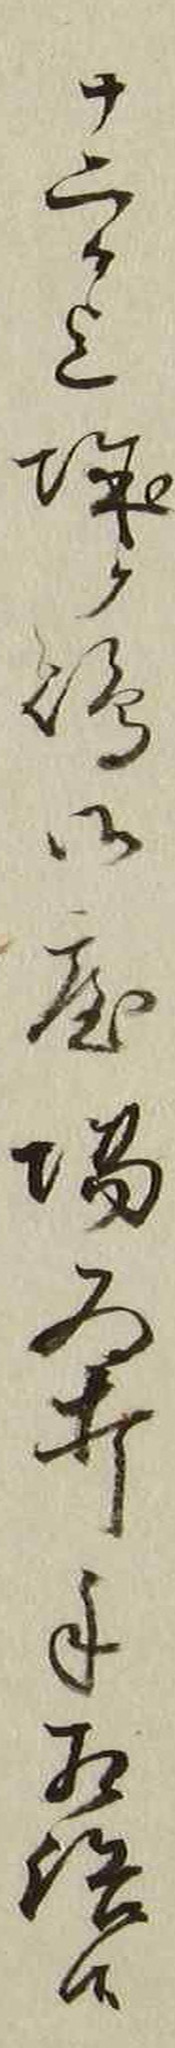十二日迄城ケ嶋御台場為打手相詰候
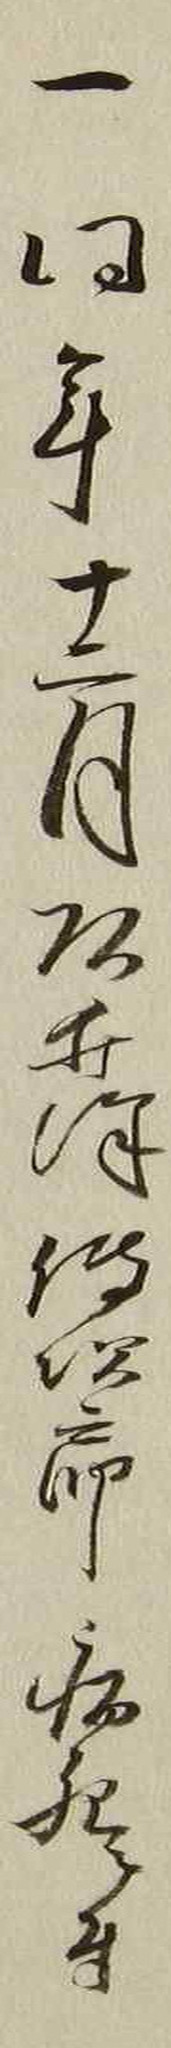一同年十二月頭井沢伝次郎病死ニ付
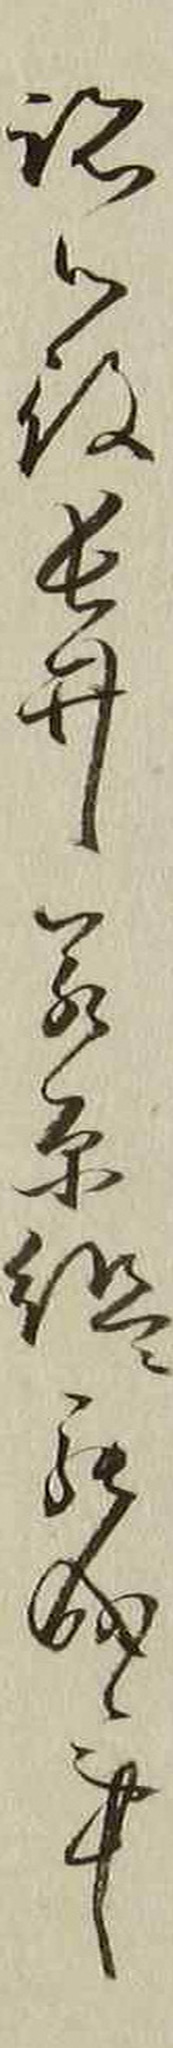跡御役長井若原組ニ罷成候事
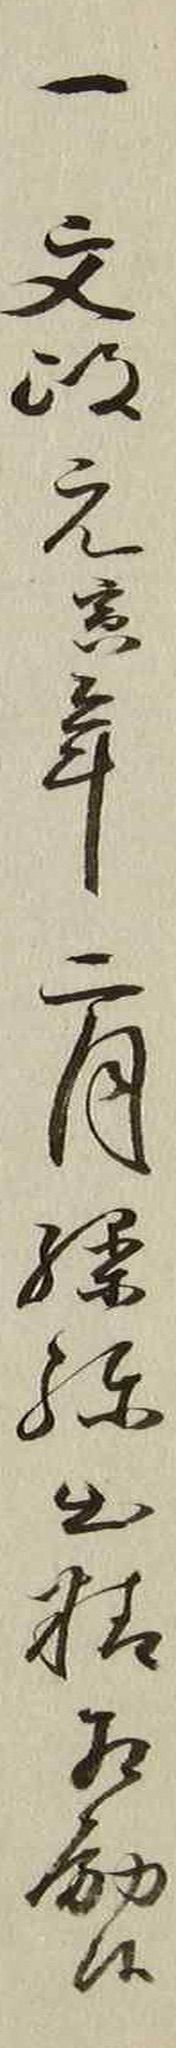一文政元寅年二月繰練出精相励候
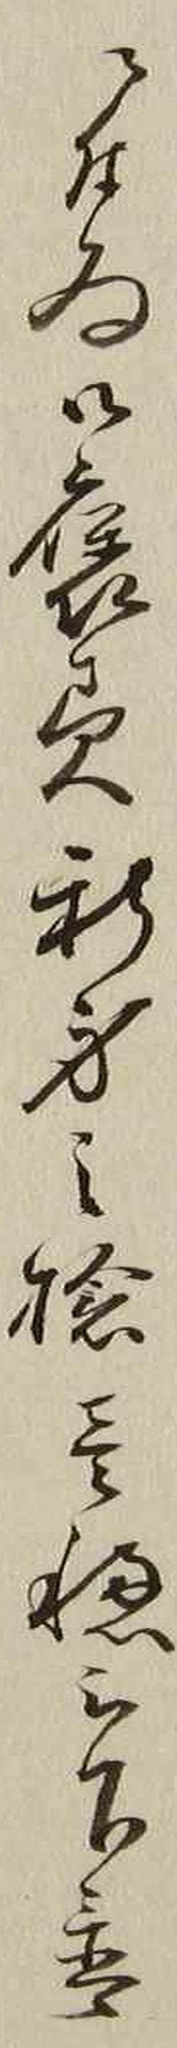ニ付為御褒美新身之槍壱穂被下置候
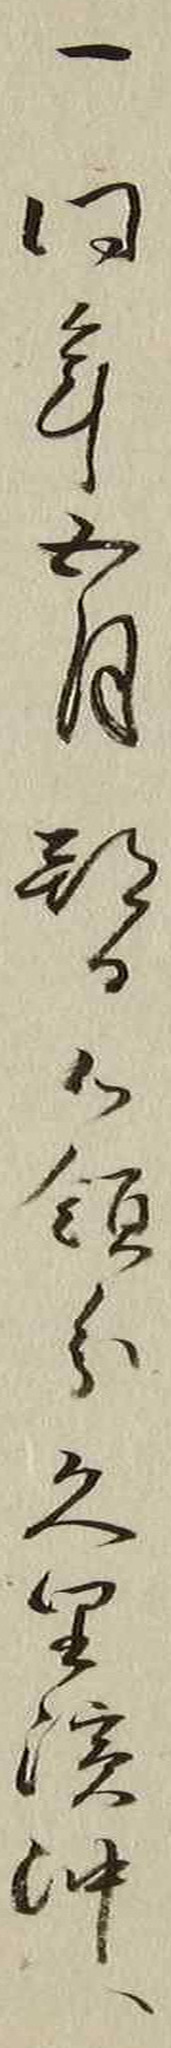一同年五月朔日御領分久里浜沖へ
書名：諸士系譜　巻之28　い之部28
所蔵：会津若松市立会津図書館
